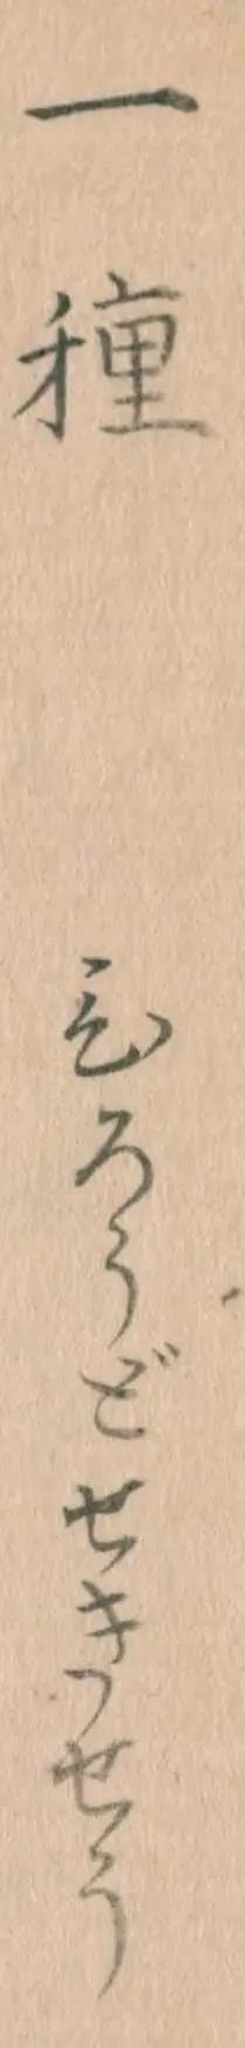一種ひろうどせきせう
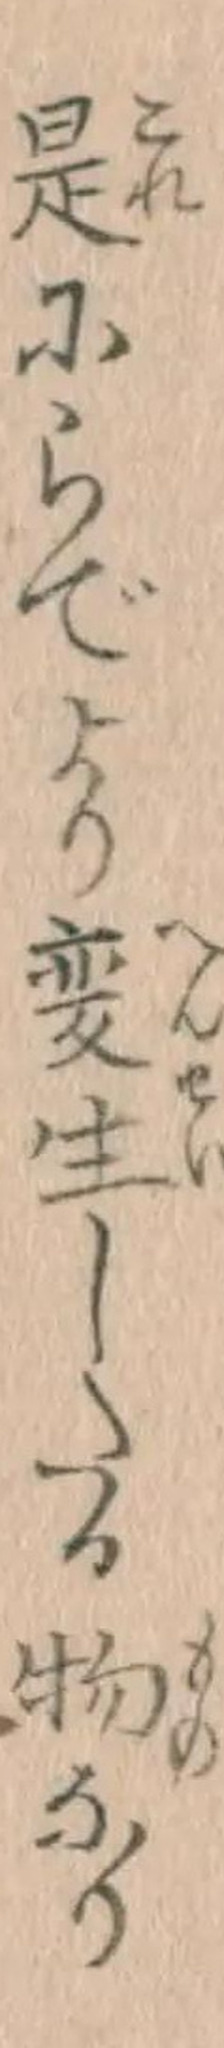是にらでより変生したる物なり
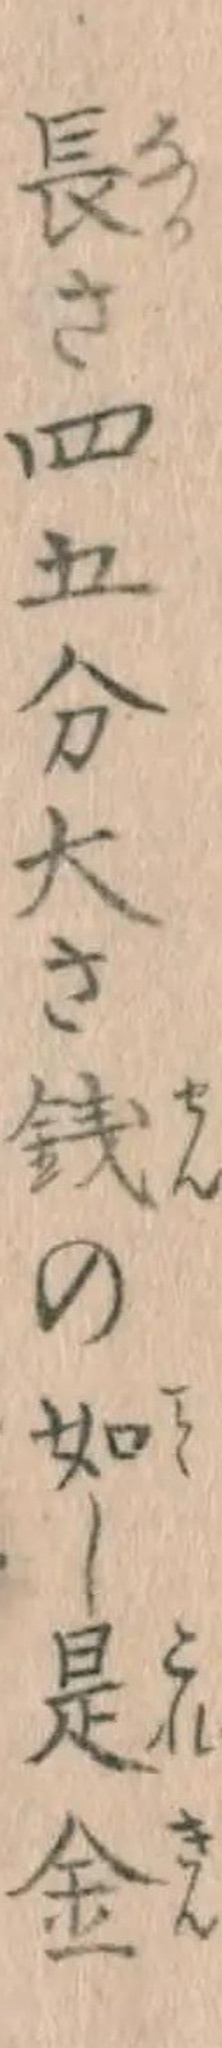長さ四五分大さ銭の如し是金
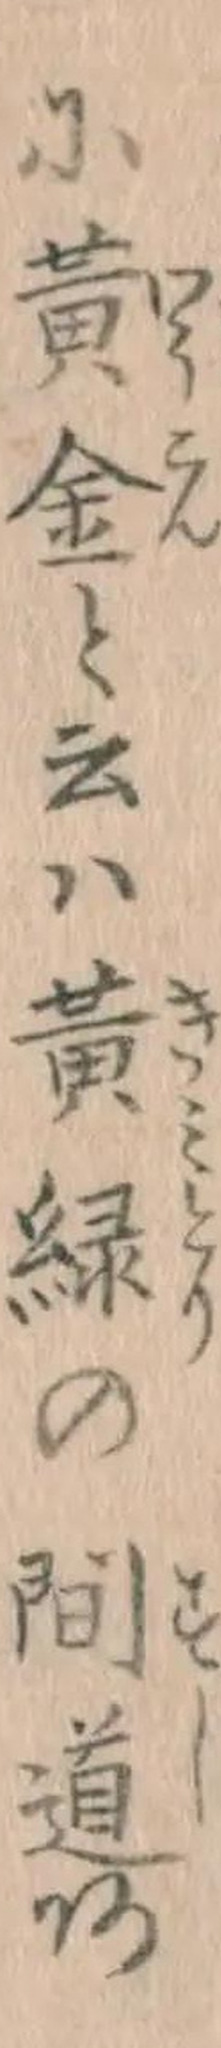に黄金と云は黄緑の間道あ
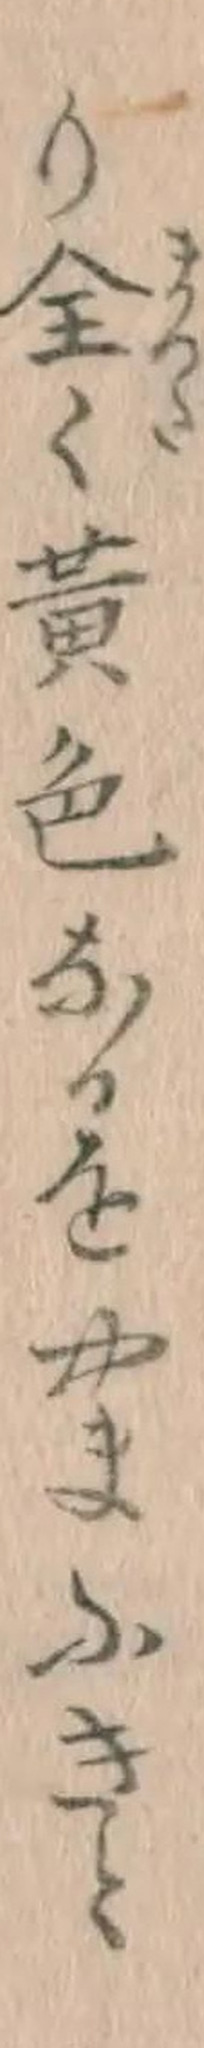り全く黄色なるをやまふきと
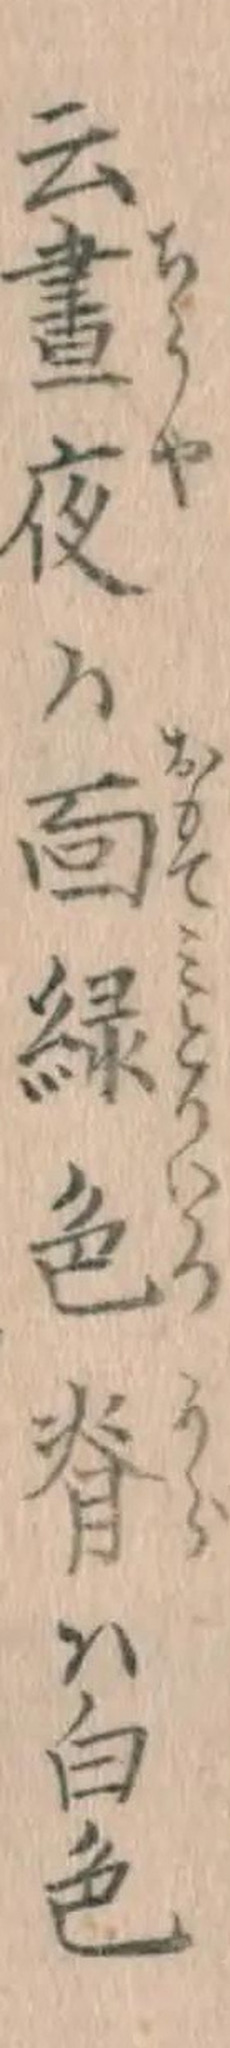云昼夜は面緑色脊は白色
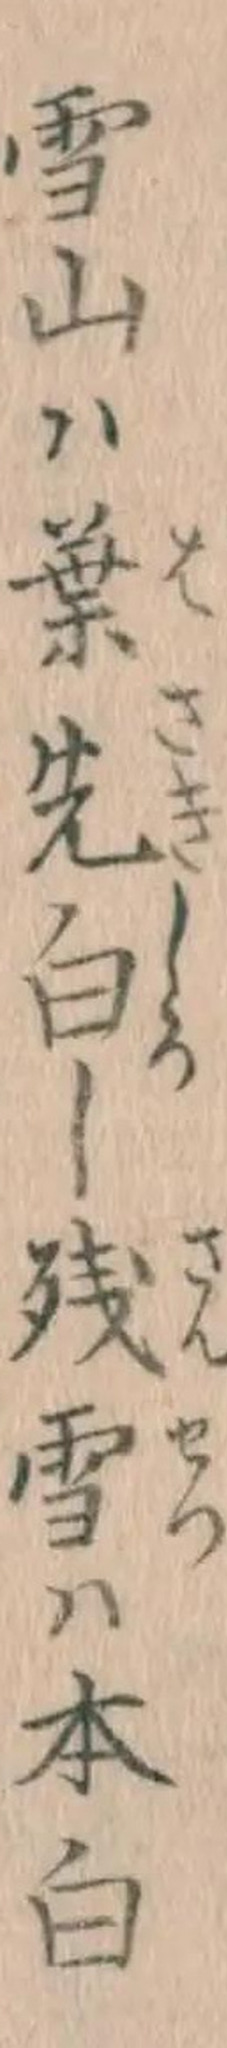雪山は葉先白し残雪は本白
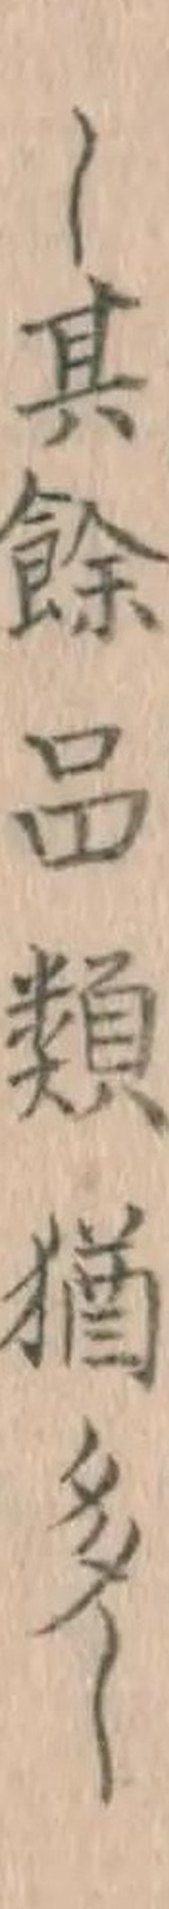し其余品類猶多し
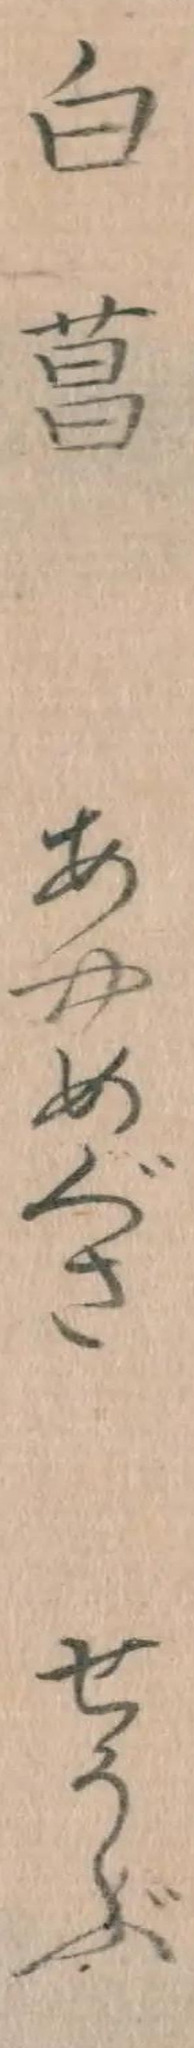白菖あやめぐさせうぶ
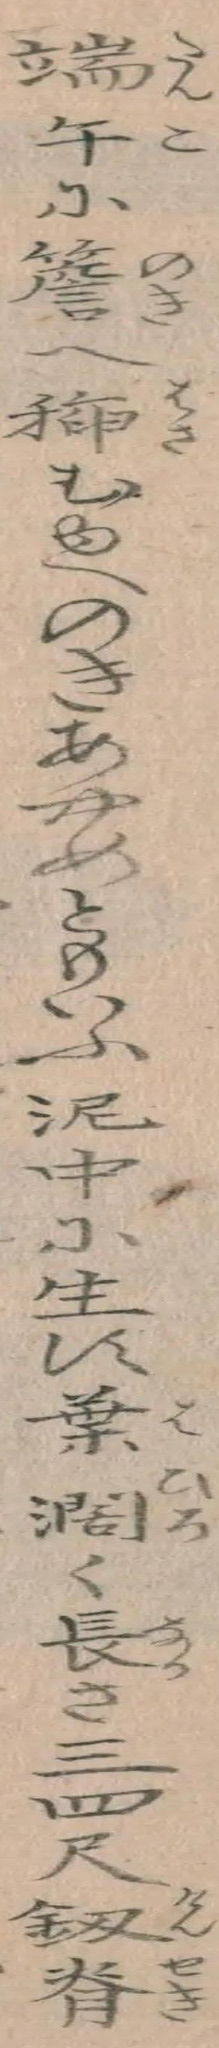端午に簷へ挿むゆへのきあやめともいふ泥中に生す葉闊く長さ三四尺剣脊
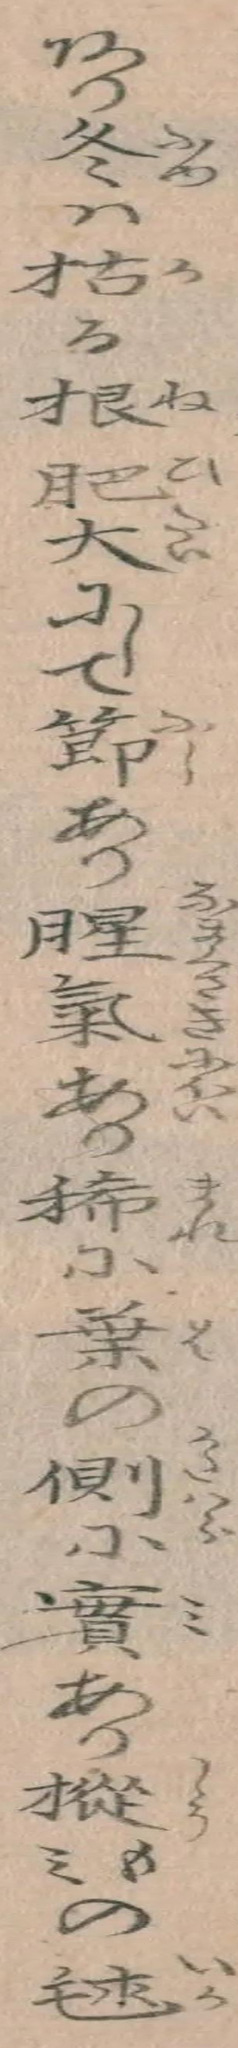あり冬は枯る根肥大にして節あり腥気あり稀に葉の側に実あり樅もみの毬
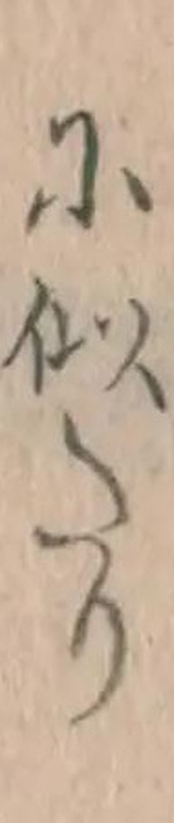に似たり
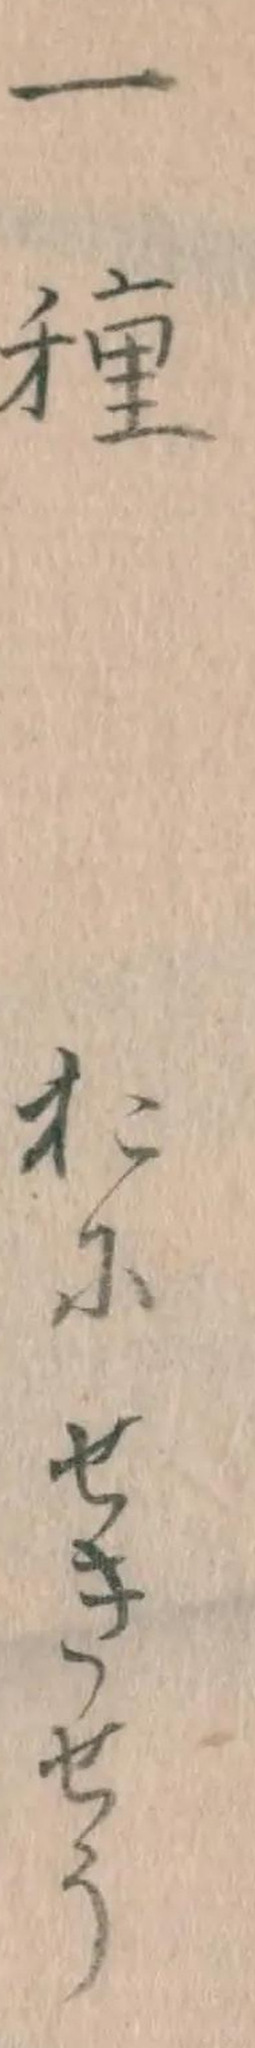一種おにせきせう
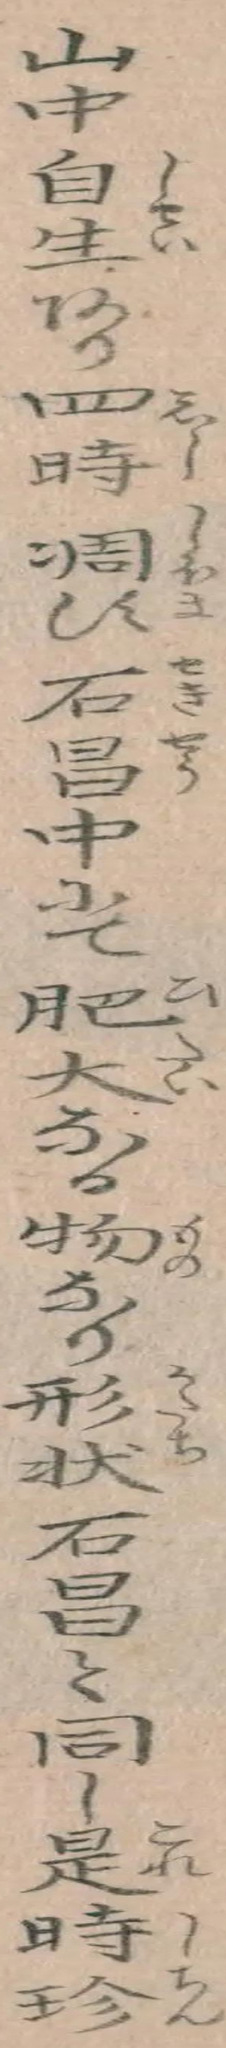山中自生あり四時凋す石昌中にて肥大なる物なり形状石昌と同し是時珍
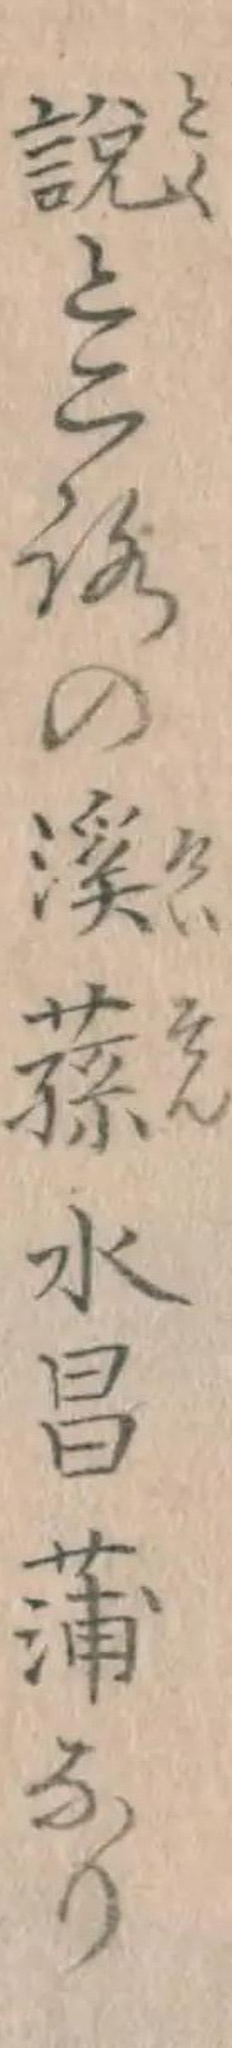説ところの渓蓀水昌蒲なり

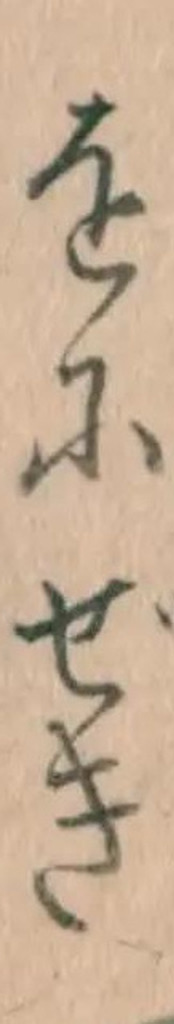をにぜき
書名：本草図譜. 巻31-33
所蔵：国立国会図書館 National Diet Library, JAPAN
